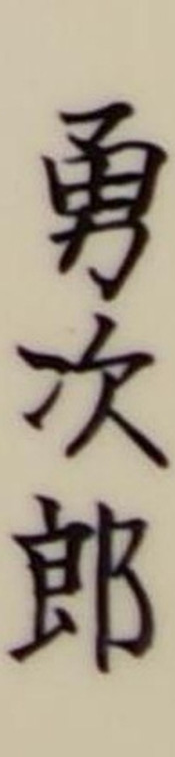勇次郎
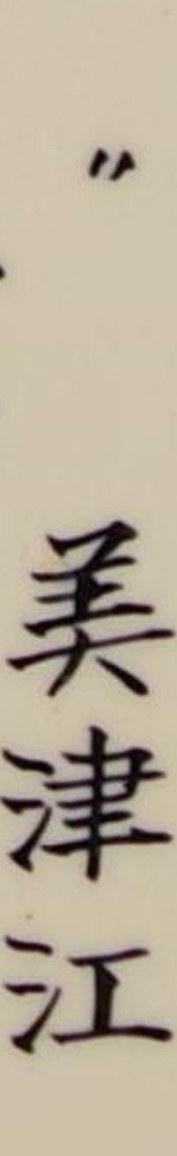美津江
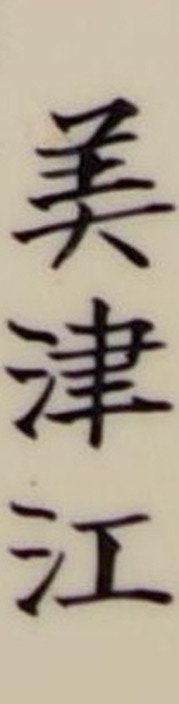美津江
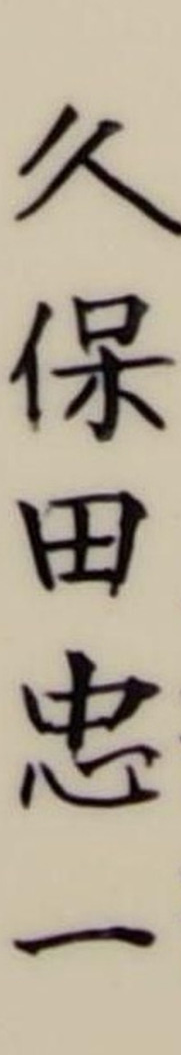久保田忠一
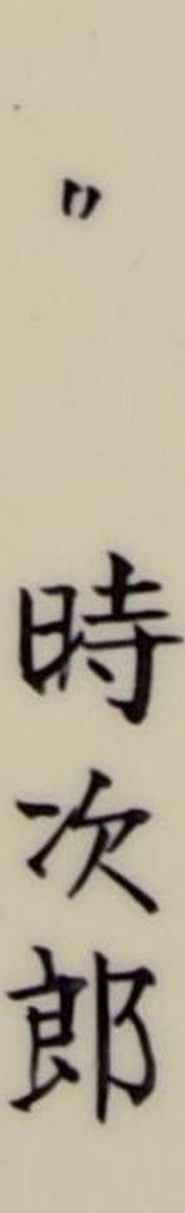時次郎
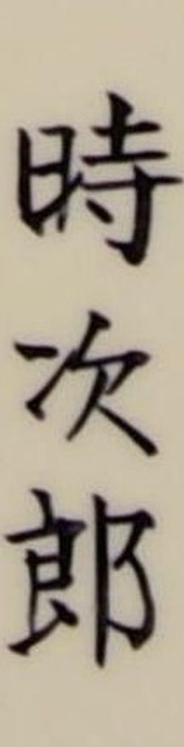時次郎
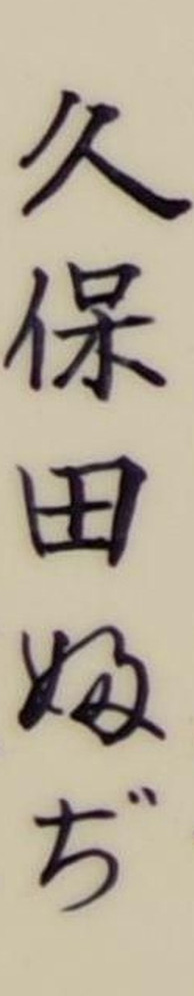久保田ふぢ
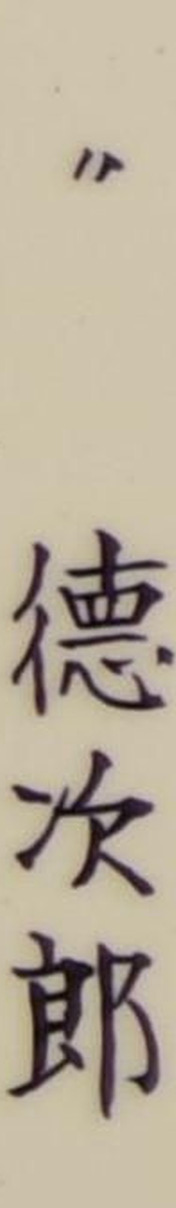徳次郎
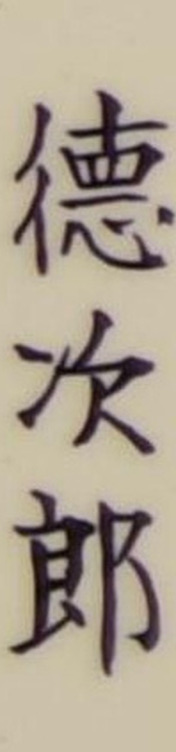徳次郎
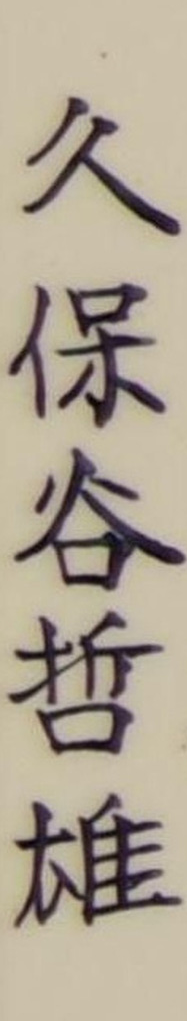久保谷哲雄

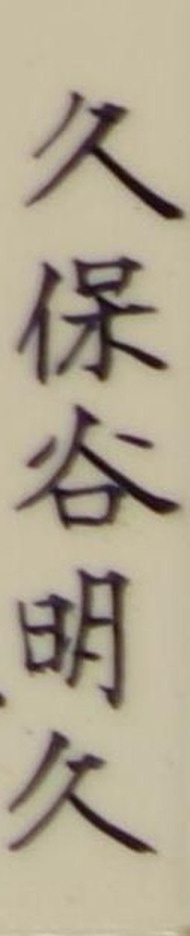久保谷明久
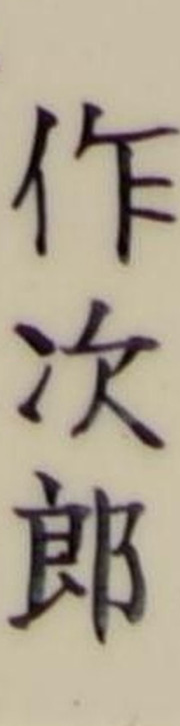作次郎
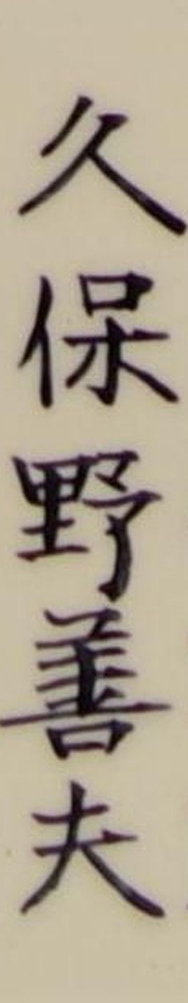久保野善夫
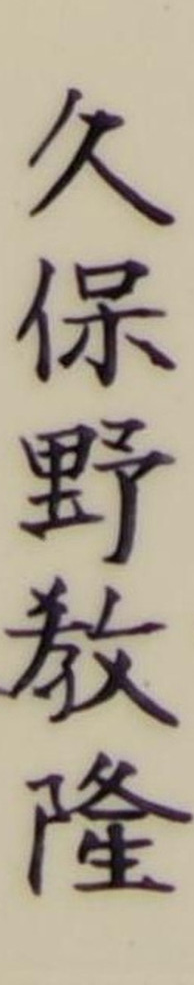久保野教隆
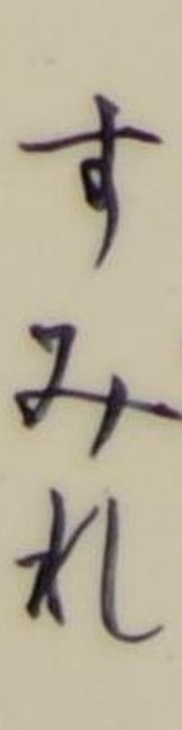すみれ
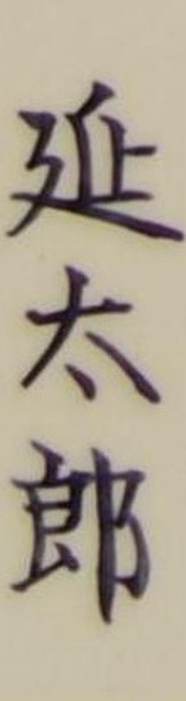延太郎
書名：A~D
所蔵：koyasan kongobuji
